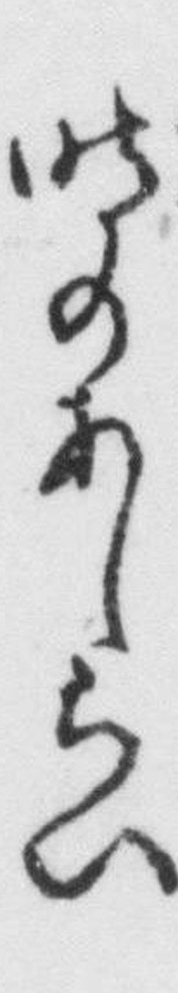時のあしらい

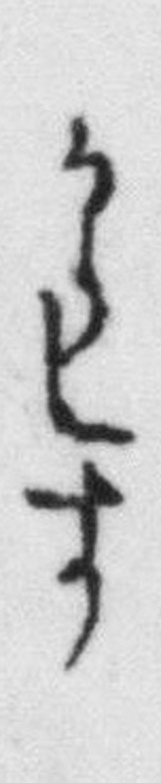からしす
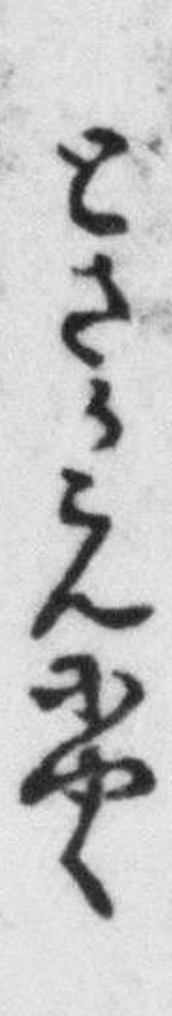とさかこんにやく
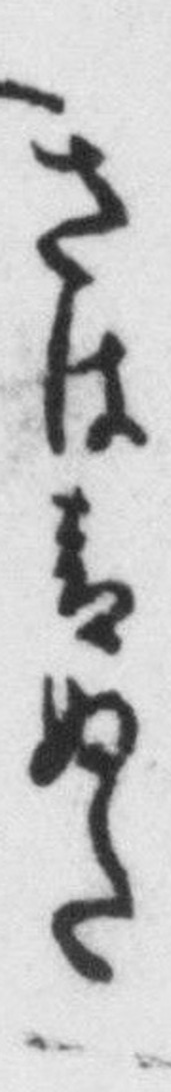さは青ぬた
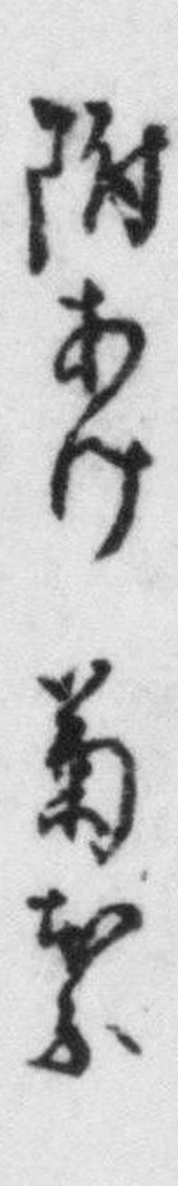附あけ菊葉
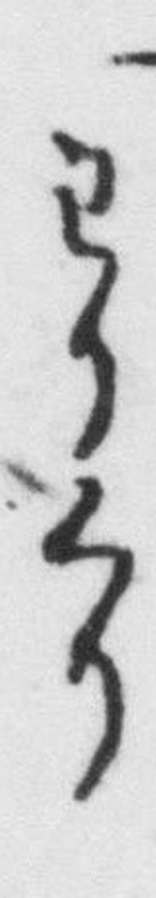わりくり
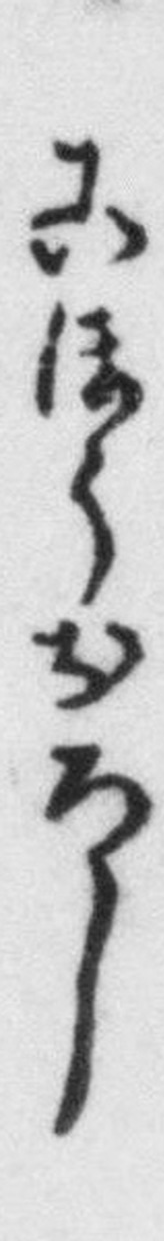こほうおろし
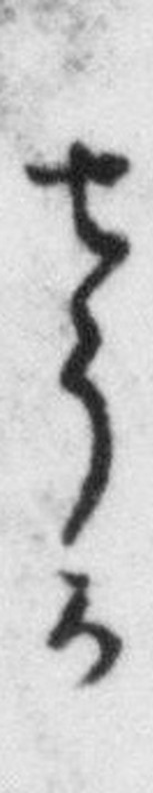せうろ
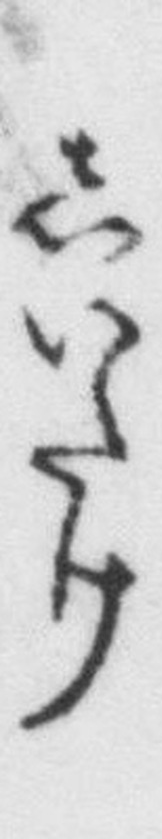しいたけ
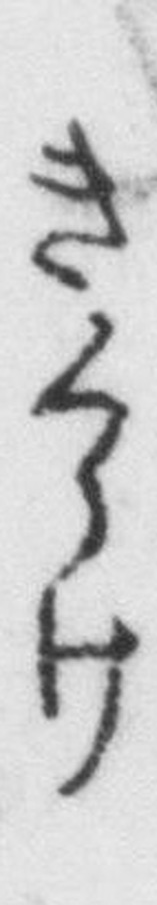きくらけ
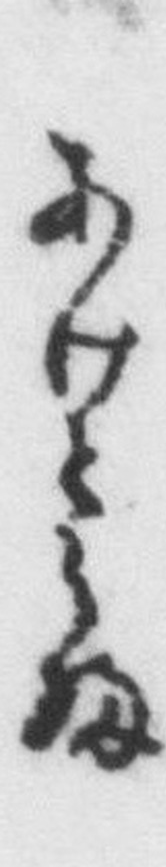あけとうふ

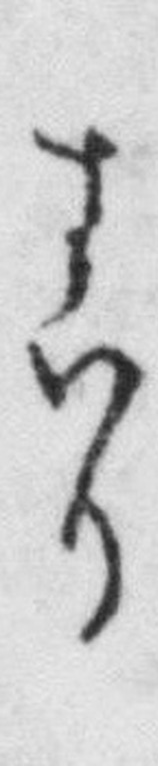すいり
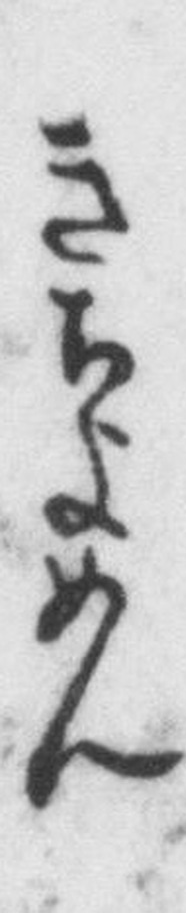きちよめん
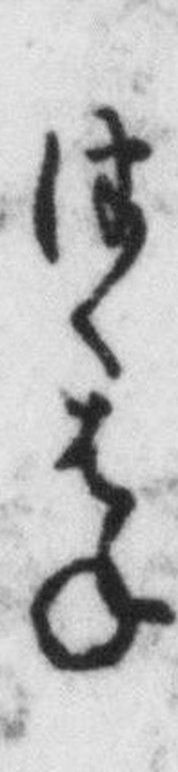つくはね
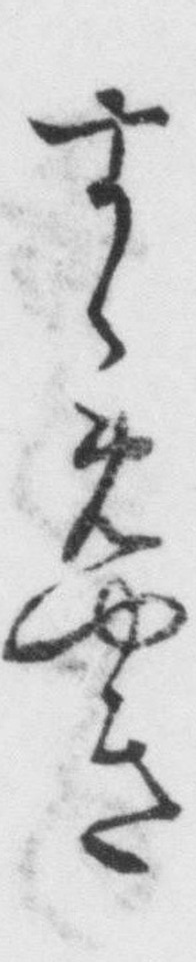すゝめやき
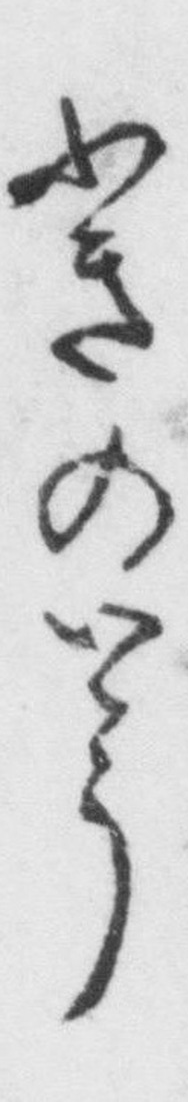ふきのとう
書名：卓子料理仕様
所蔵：大阪府立大学学術情報センター 国文学研究資料館
